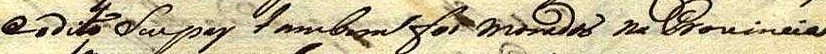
e o dito Seu pay tambem foi morador na Provincia
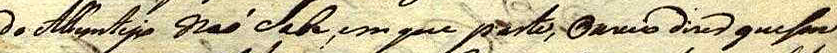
de Allentejo naõ sabe, em que parte, ouvio dizer que sen
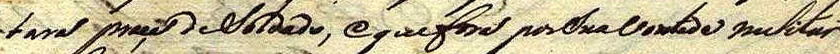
tara praça de Soldado, e que fora por Sua vontade militar
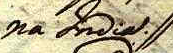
na India.//
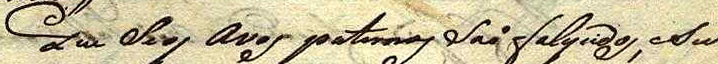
Que seos avos paternos saõ falescidos, e se
